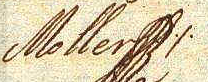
Moller
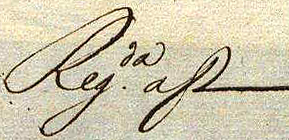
Reg.da a f
